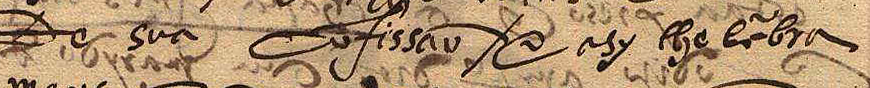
De sua Co̅fissão / e asy lhe lēbra
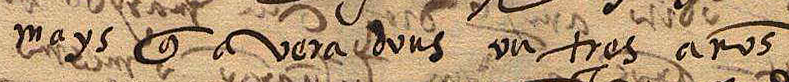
mays q̄ avera dous ou tres an̄os
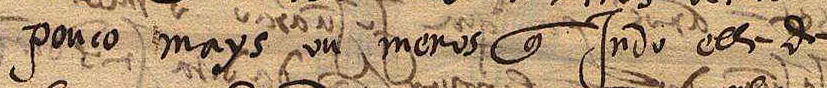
pouco mays ou menos q̄ Jndo elle de
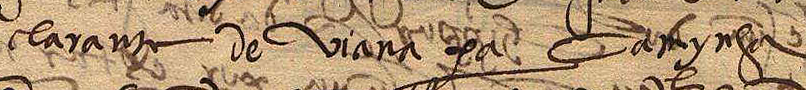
clarante de viana ꝑa Camynha
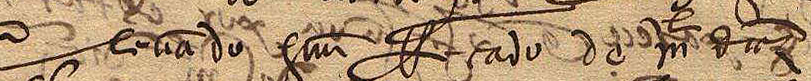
e leuādo huū Recado de mel diaz
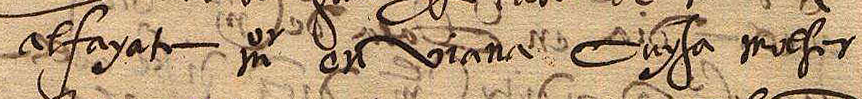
alfayate mor en viana CuyJa molher
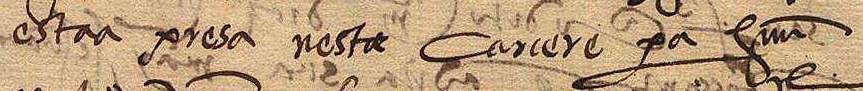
estaa presa neste Carcere ꝑa huū
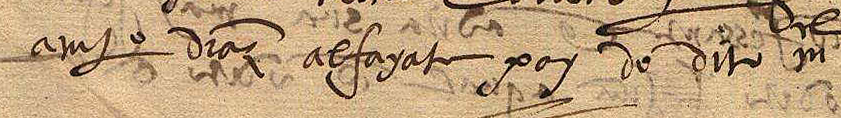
amto diaz alfayate pay do dito mel
